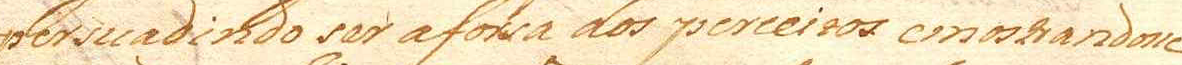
persuadindo ser a forsa dos perceitos e mostrandosse
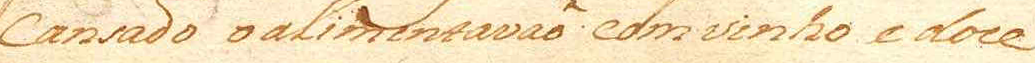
Cansado o aLimentavaõ com vinho e doce
